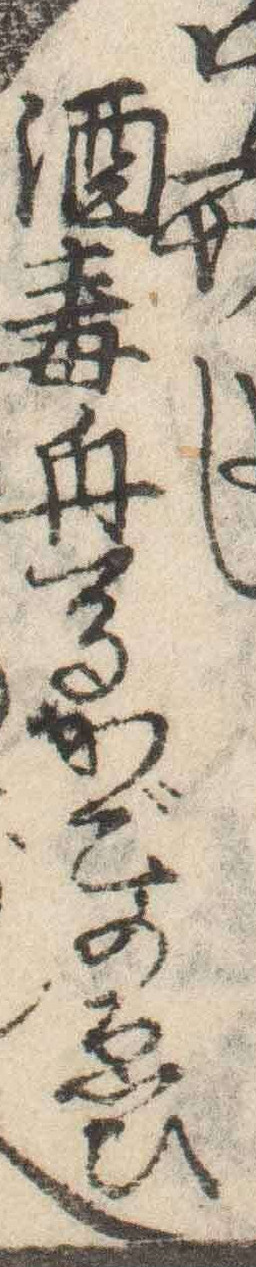酒毒舟馬かごのゑひ
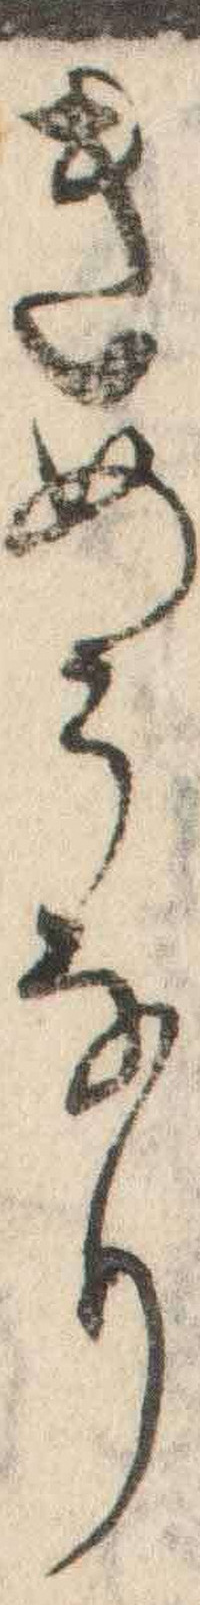きめうなり
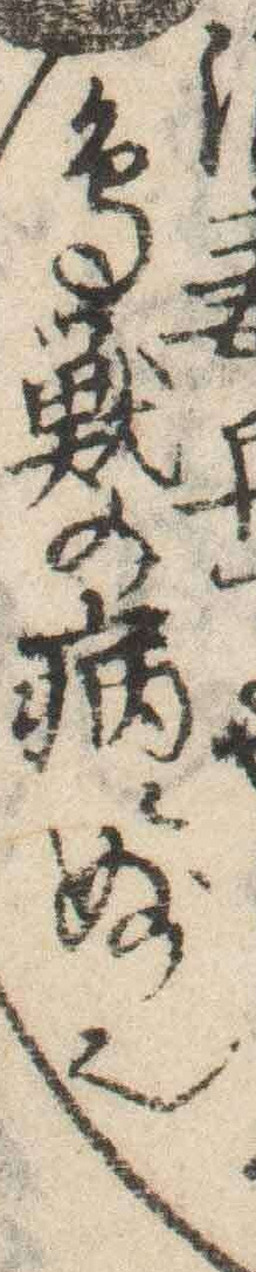鳥獣の病に妙也
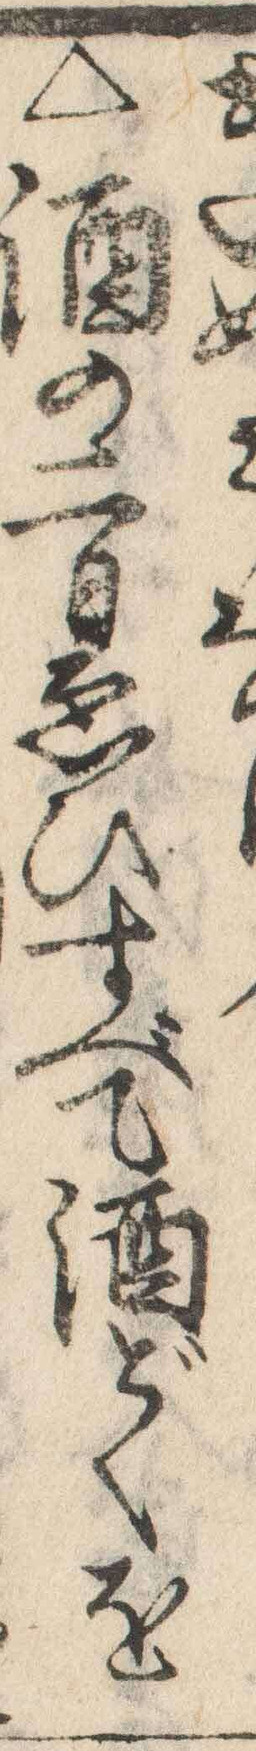△酒の二日ゑひすべて酒どくを
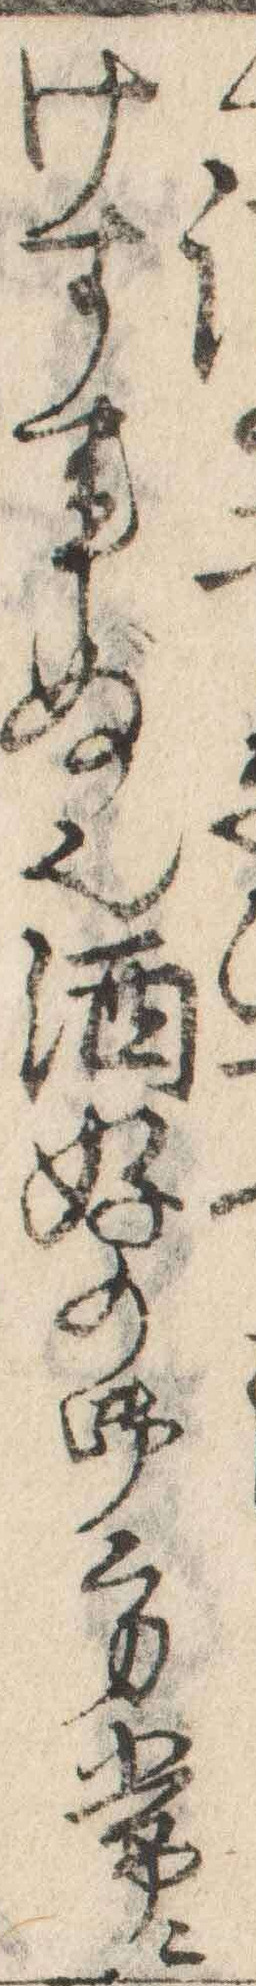けす事妙也酒好の御方常に
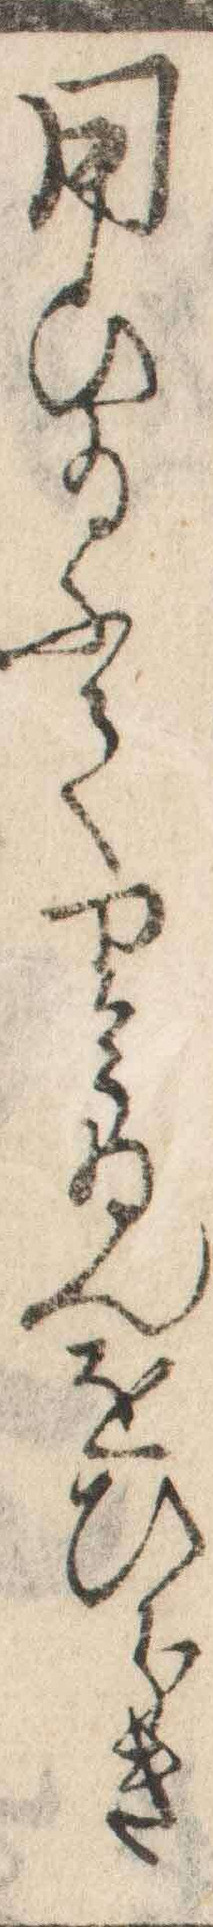用ひ給ふてりうゐんをひらき
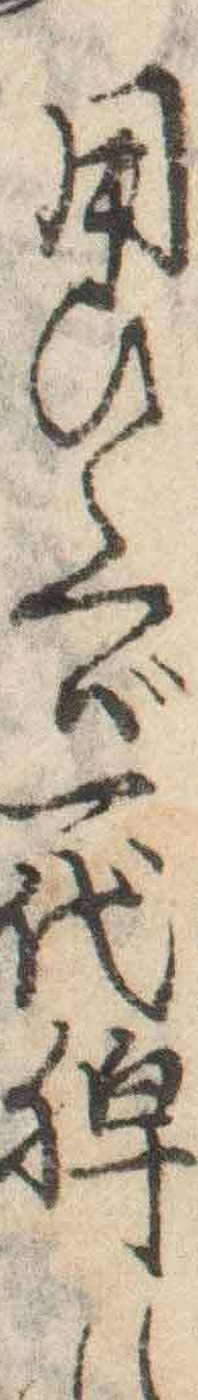用ひくば一代脾銅
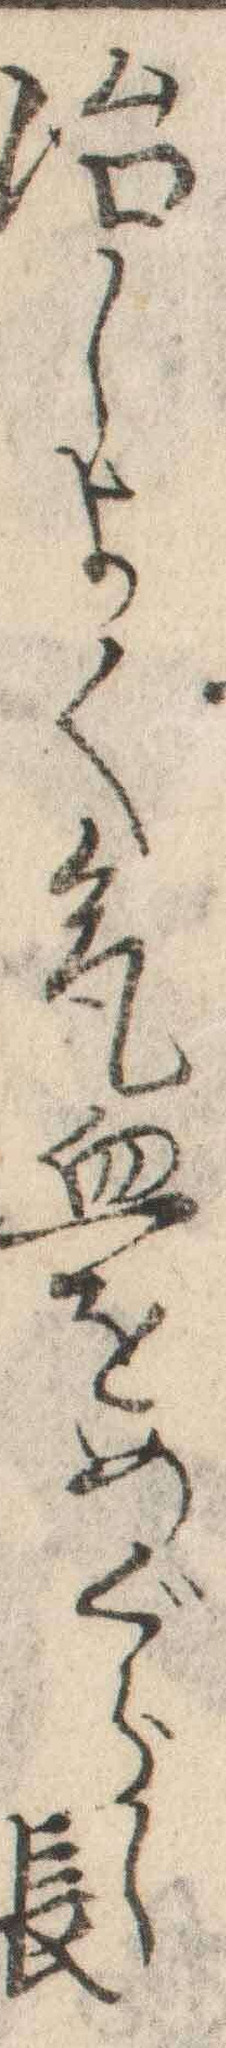治しよく気血をめぐらし長
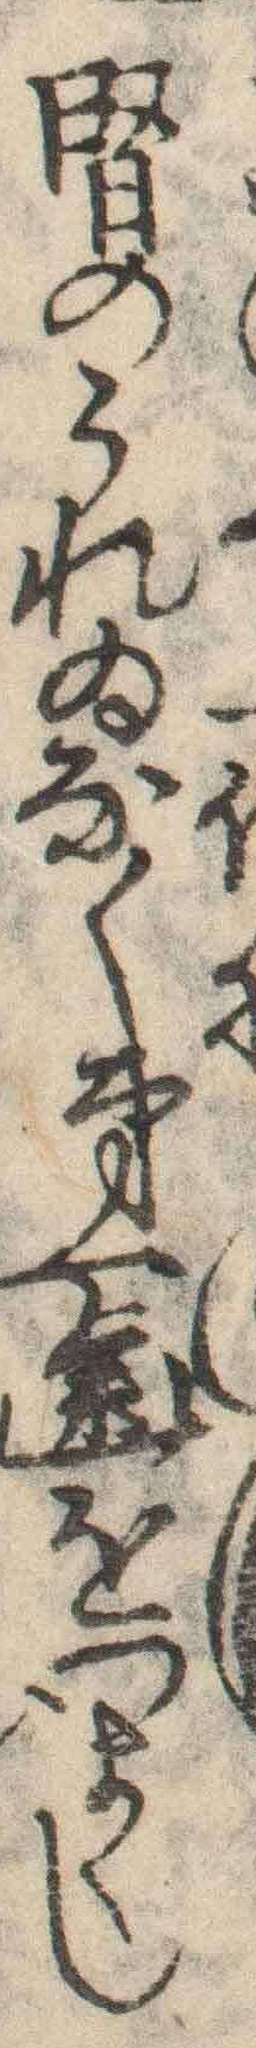ゐ腎のうれゐなく第一歯をつよくし
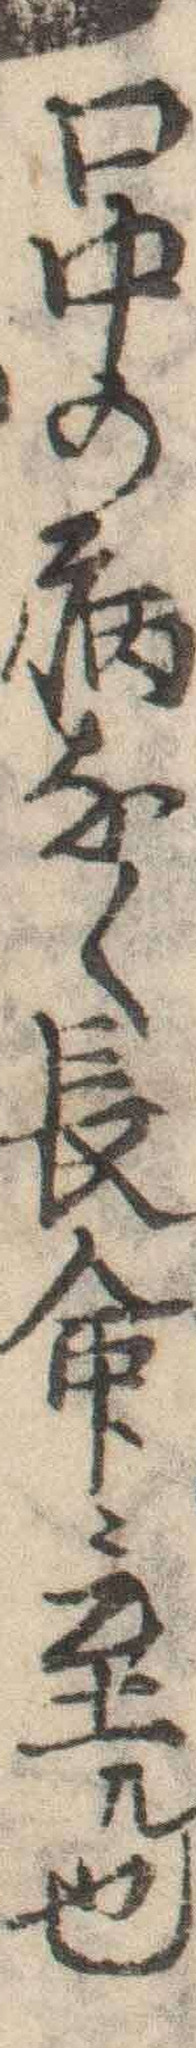口中の病なく長命至也
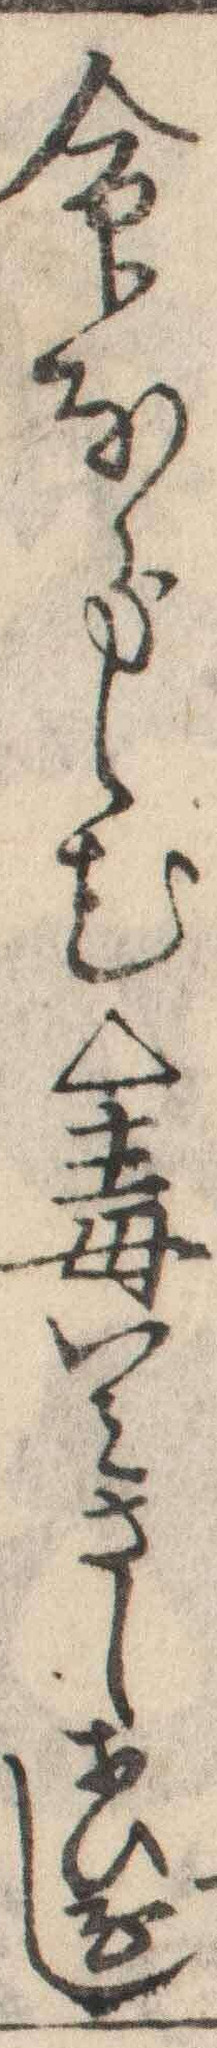命ならしむ△毒いみさしあいなし
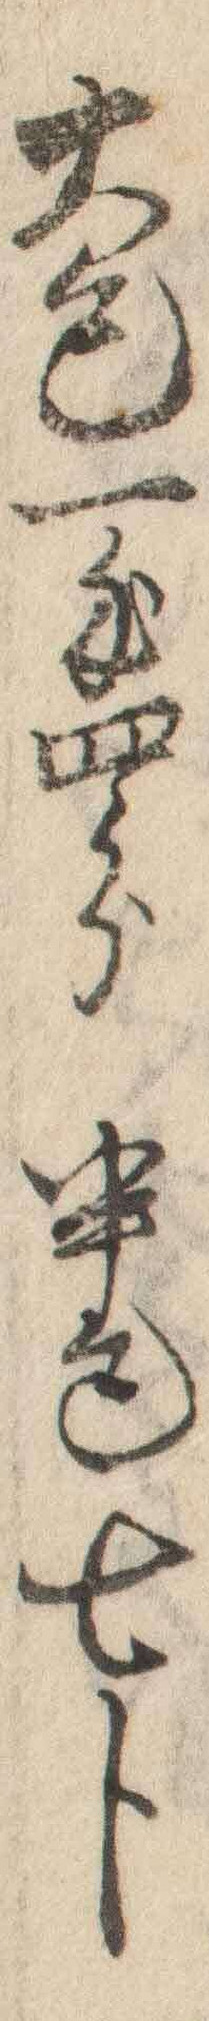大包一匁四分半包七分

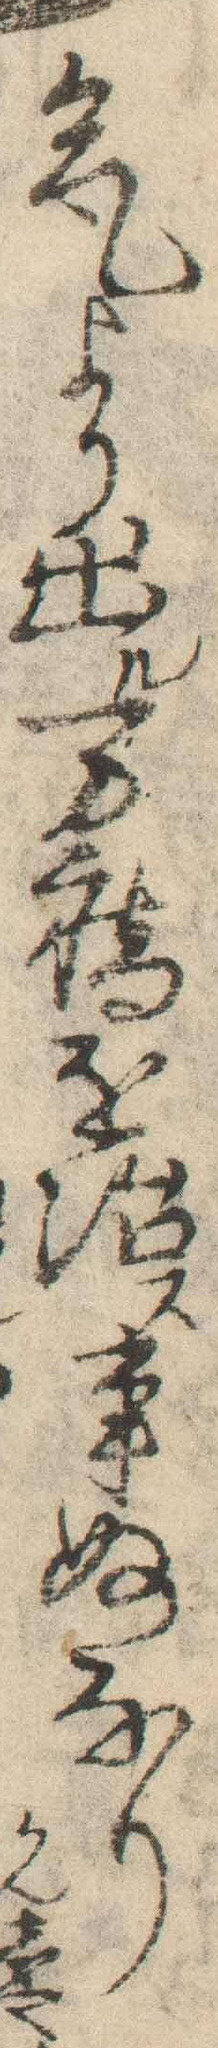気より出万病を治事妙なり
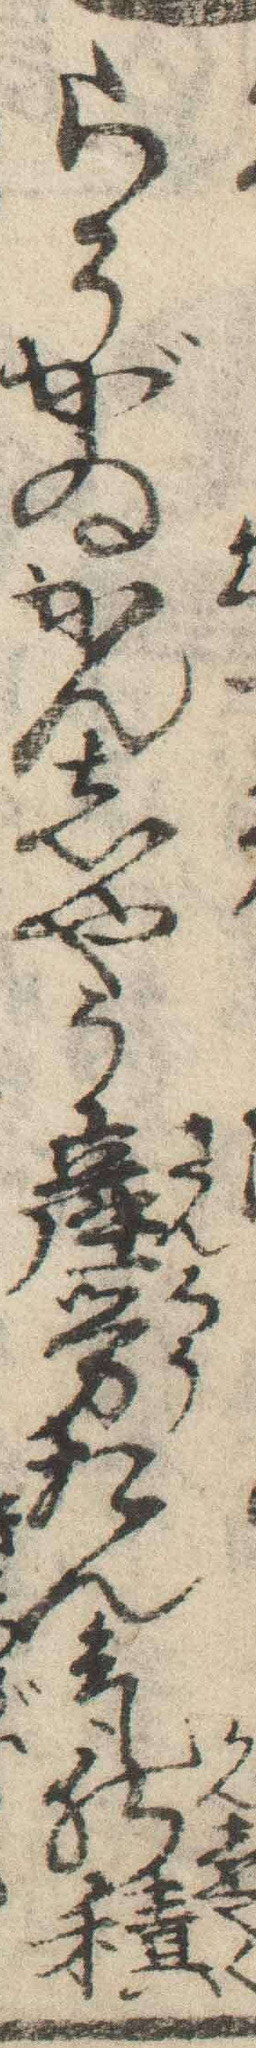らうがゐかんしやう産労たん気肝積
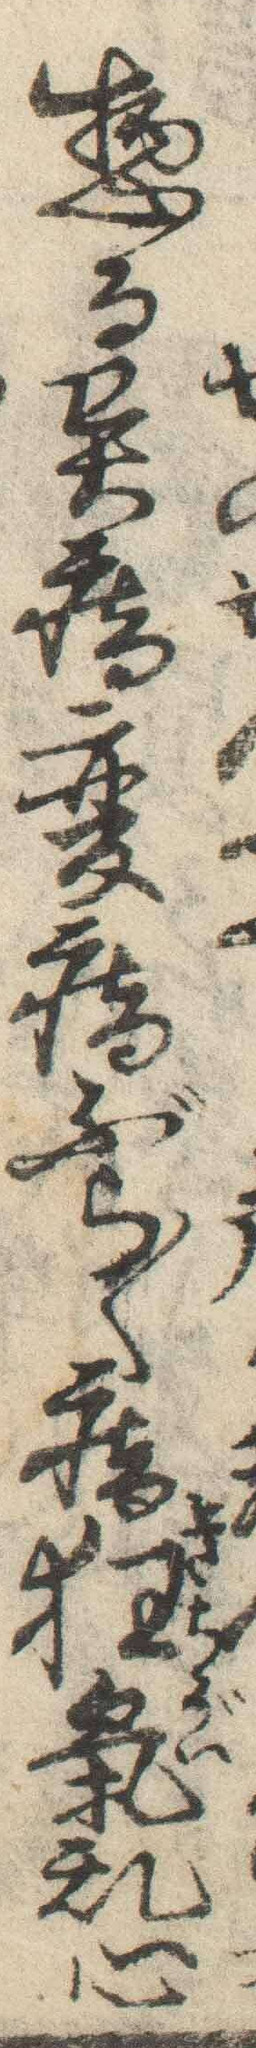総て異病変病ぶら〳〵病狂気乱心
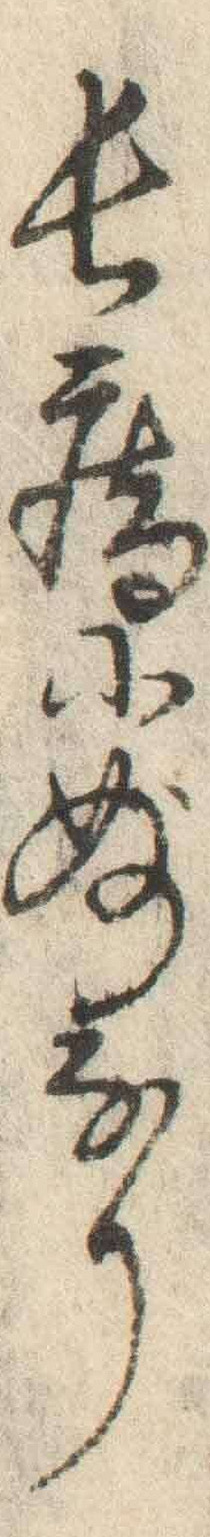長病に妙なり
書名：撫育草
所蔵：東京学芸大学附属図書館 国文学研究資料館
